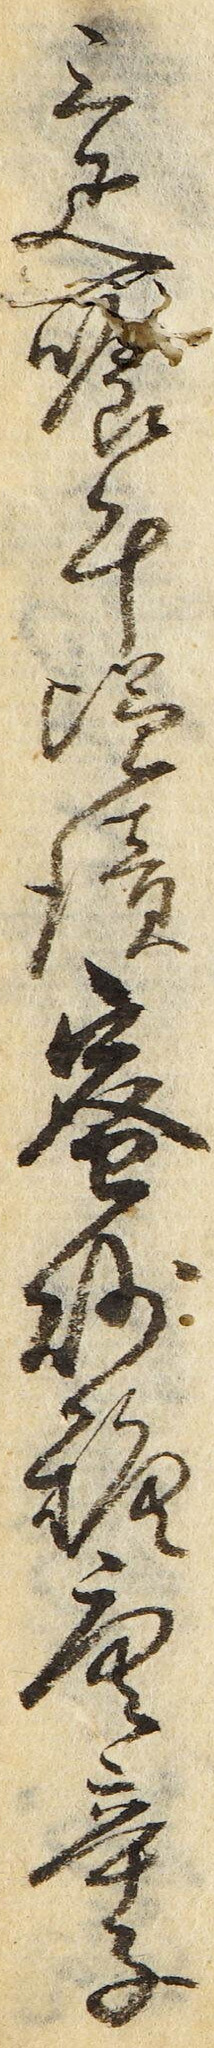三疋食干塩漬蜜砂糖唐辛子

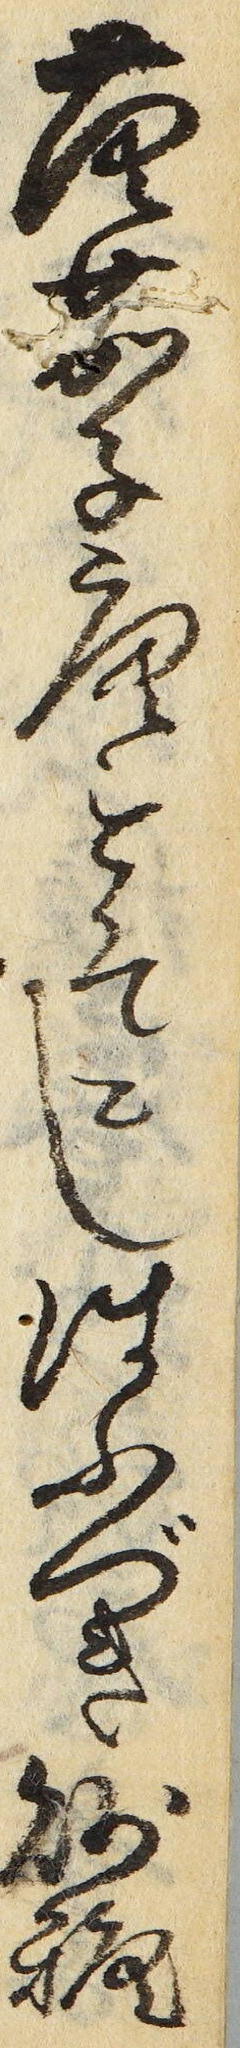唐茄子唐もそこしほふづき砂糖
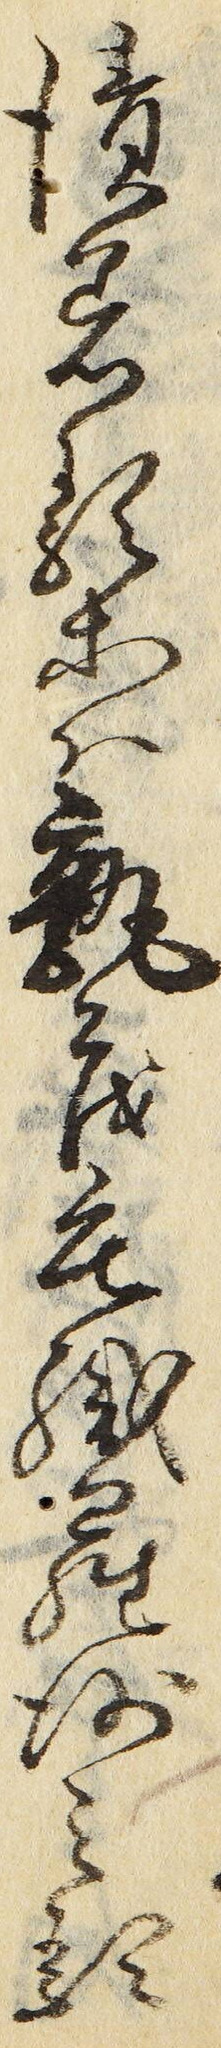漬着類等ハ孰も毛織羅沙之類
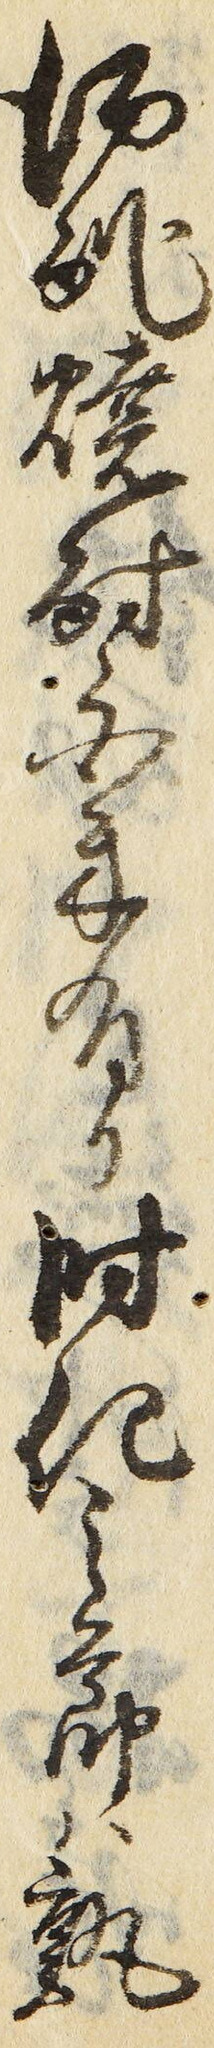酒酢焼酎白米有り時化之節ハ孰
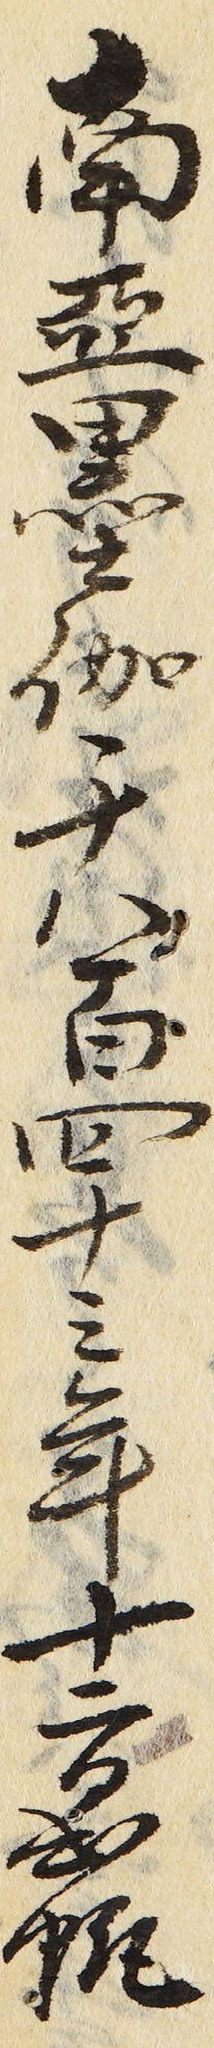南亜墨伽千八百四十三年十二日出帆
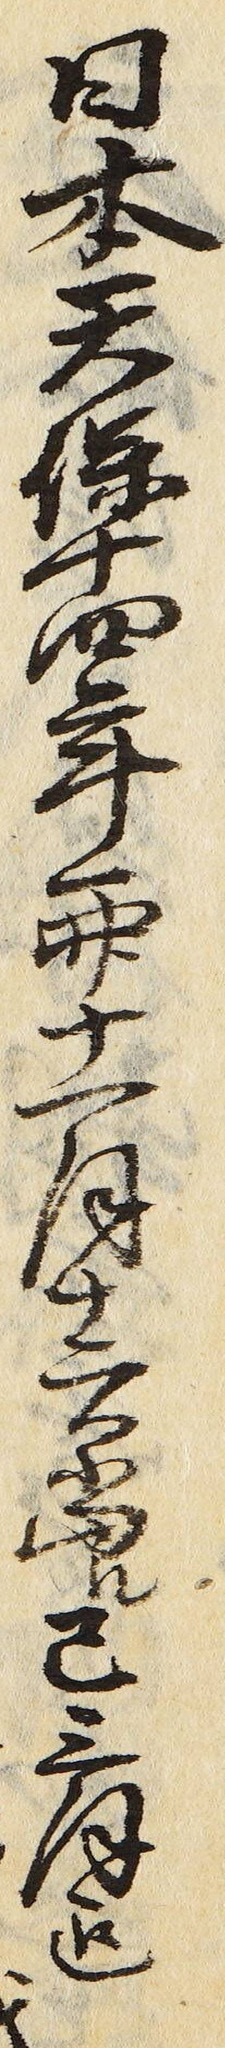日本天保十四年酉十一月十二日当ル巳三月迄三年成
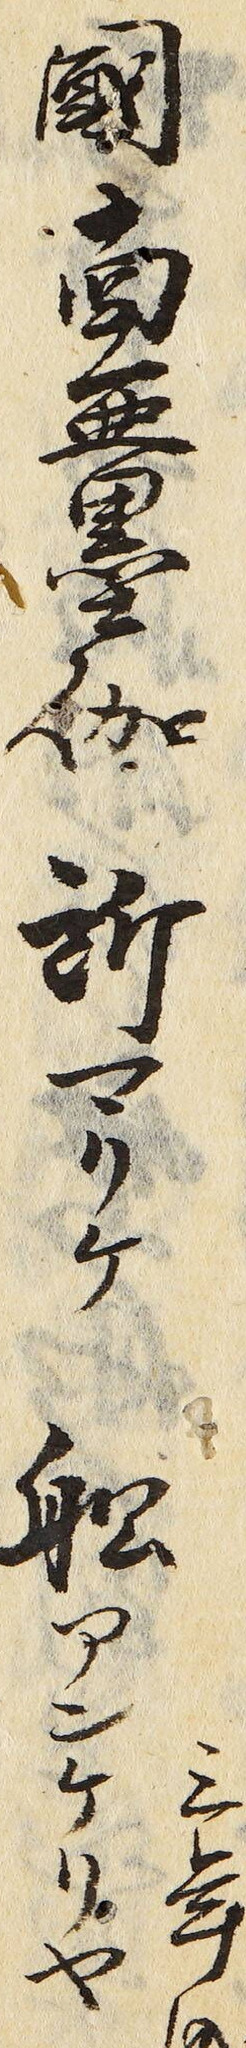国南亜墨伽所マリケ船アンケリヤ
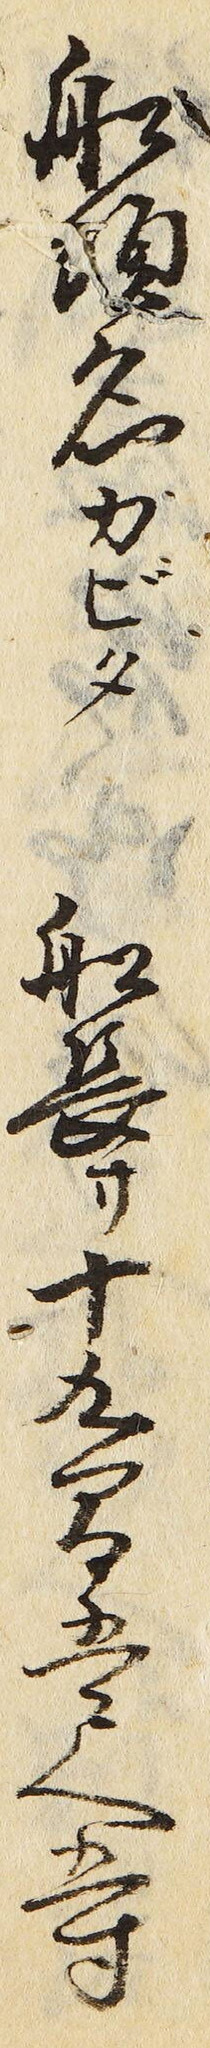船頭名カビタ船長サ十九間五尺五寸
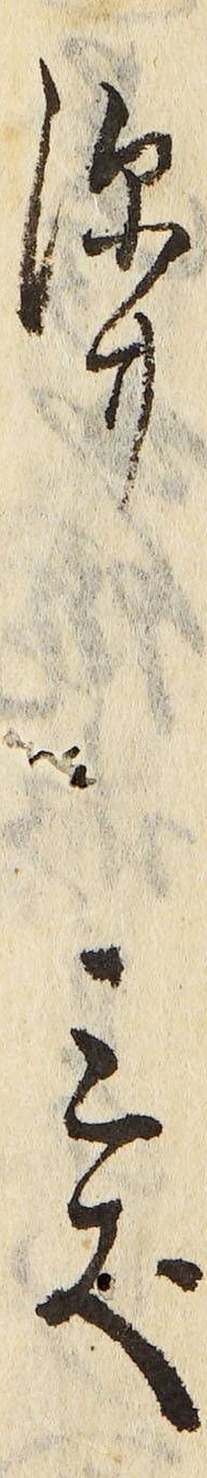深サ三丈
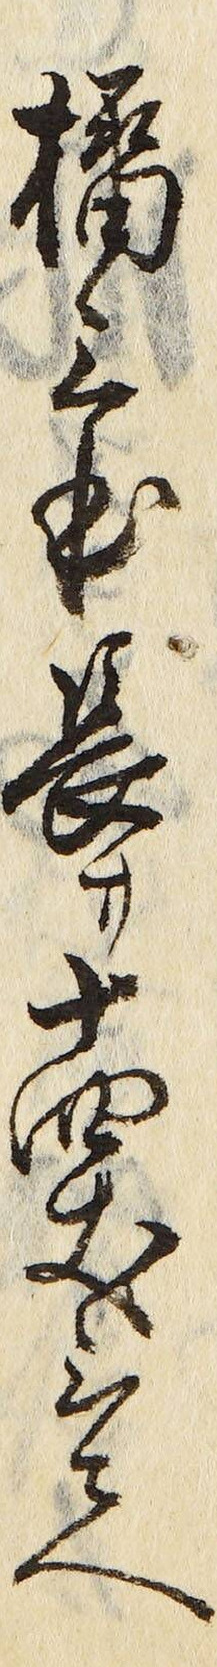檣三本長サ十四丈三尺
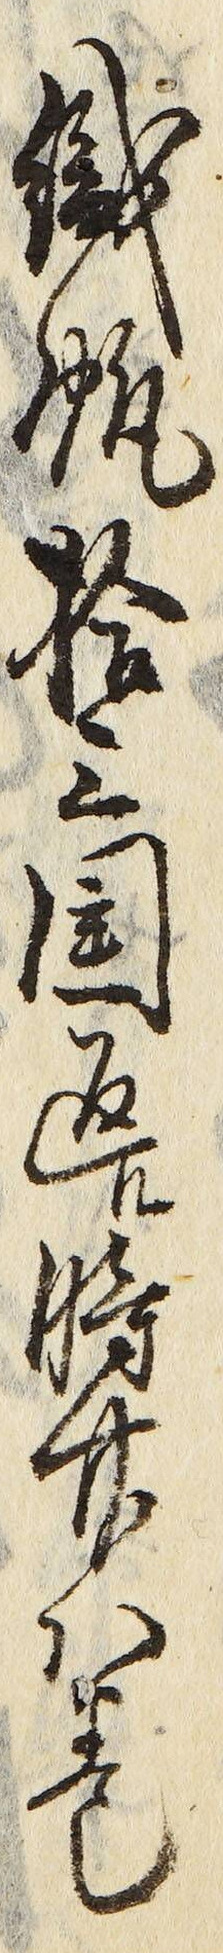織帆拾三返ル時廿八巻
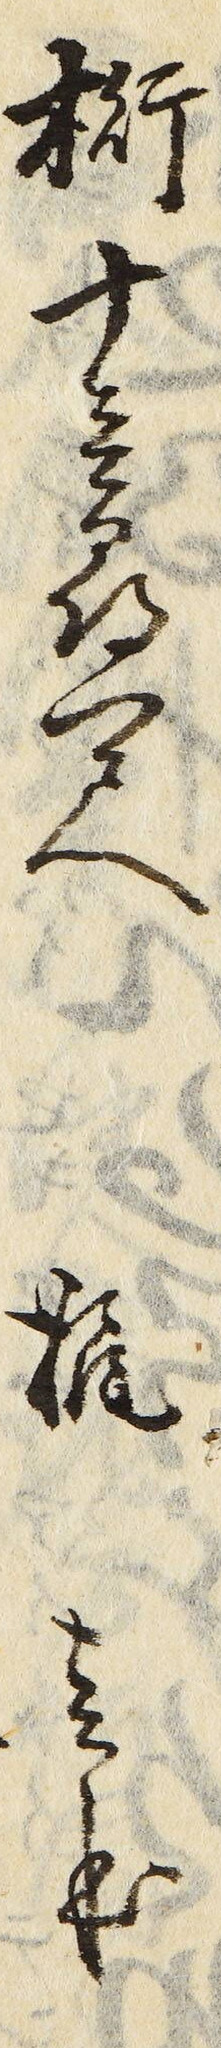桁十壱尋一尺梶壱本
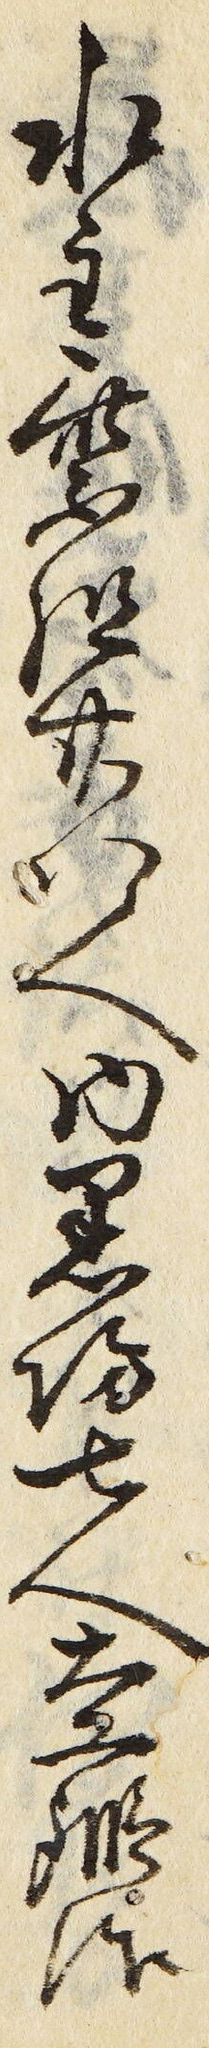水主乗組廿八人内黒坊七人大工鍛冶
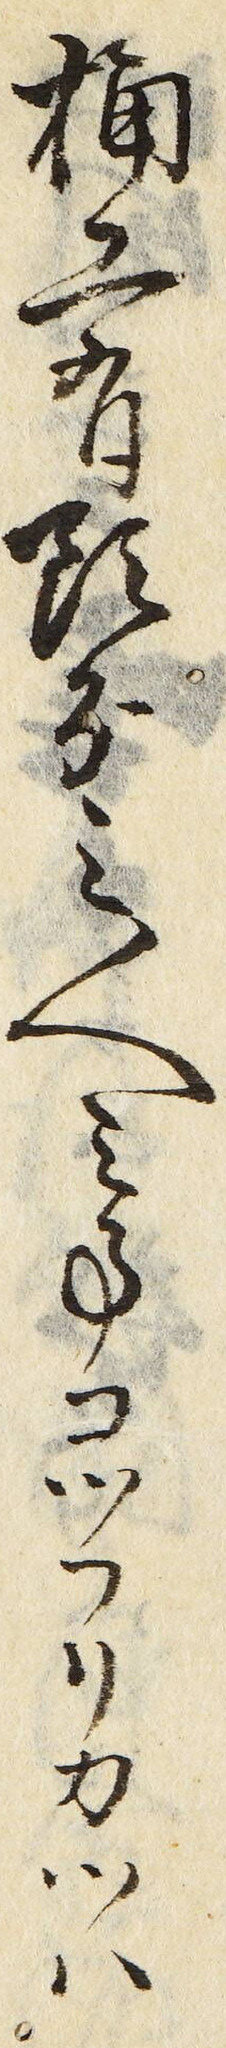桶工有頭分之人之事コツフリカツハ
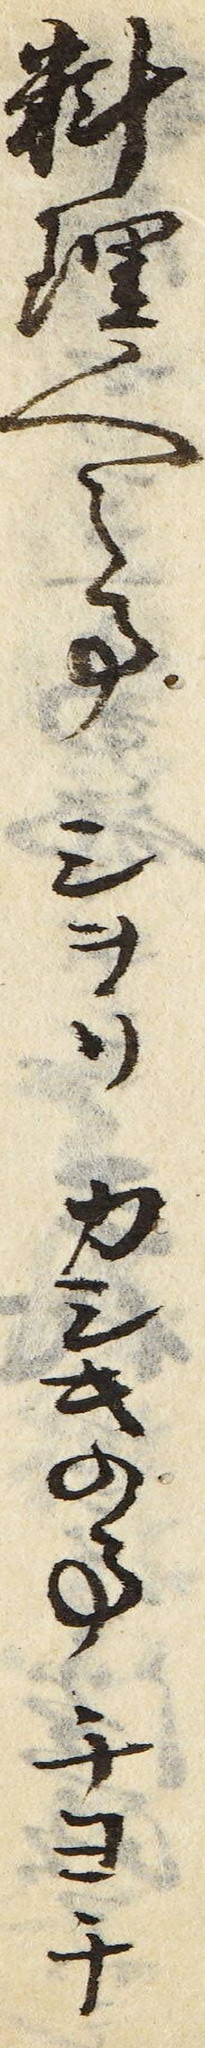料理人之事シヲリカシキの事チヨチ
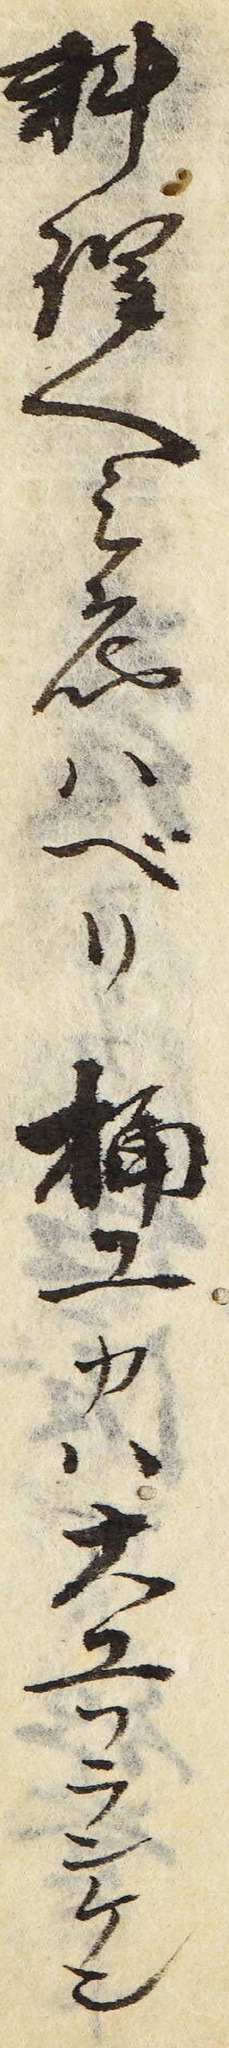料理人之ハベリ桶工カハ大工フランケン
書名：阿波幸宝丸漂流記
